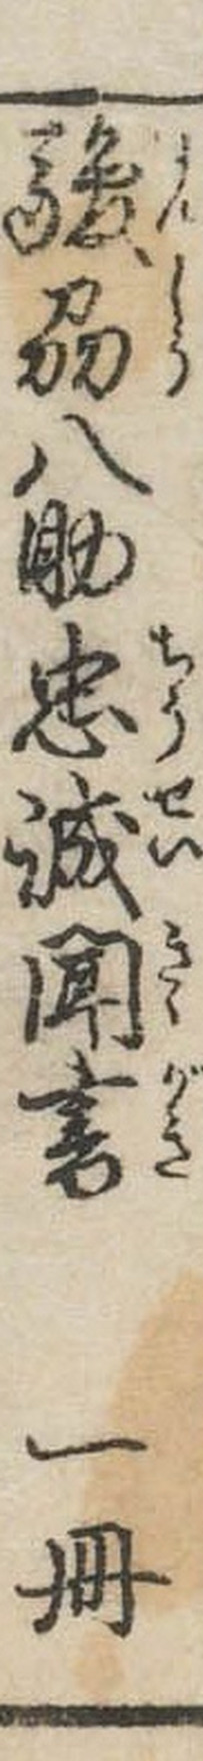駿州八助忠誠聞書一冊
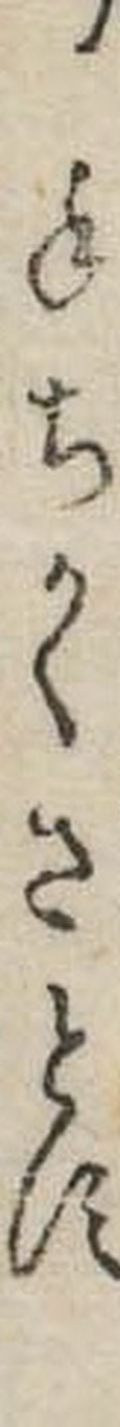手ちかくさとす
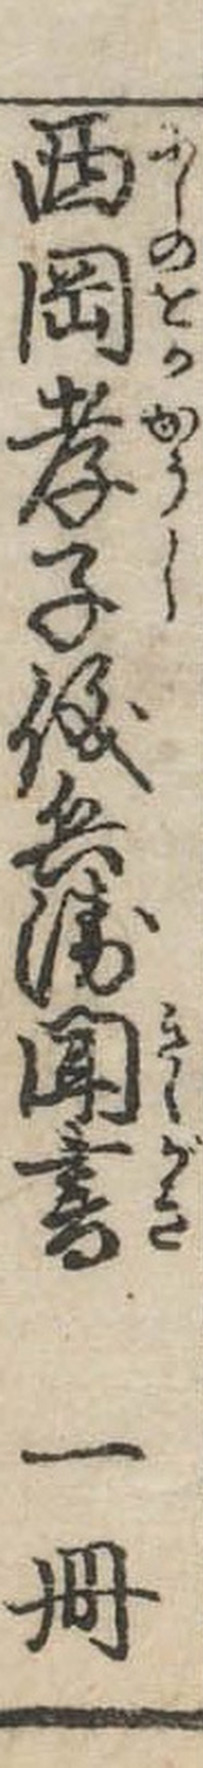西岡孝子儀兵衛聞書一冊
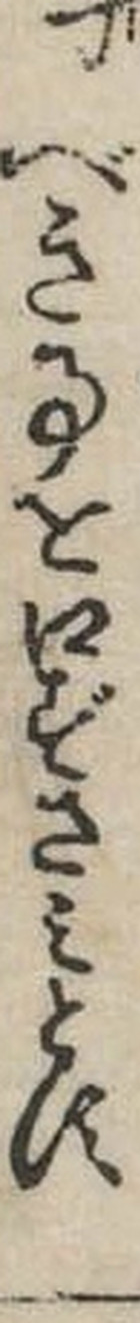べき事を口ずさみとす
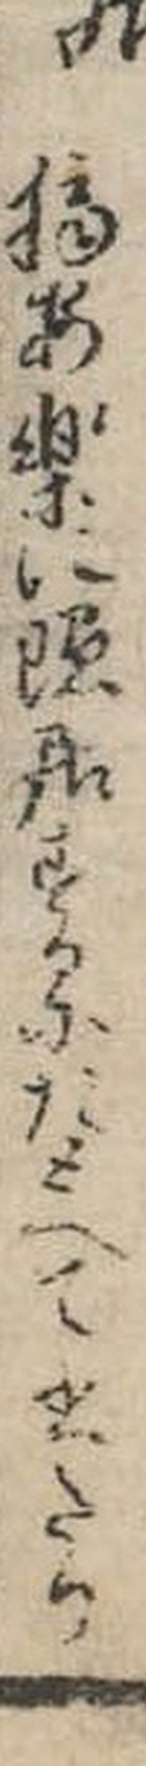臍安楽に隠居するにたとへて書たり
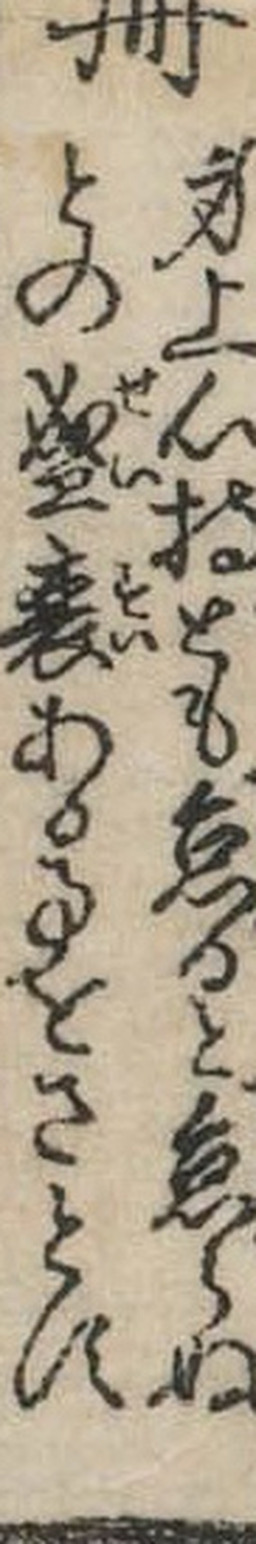との盛衰ある事をさとす
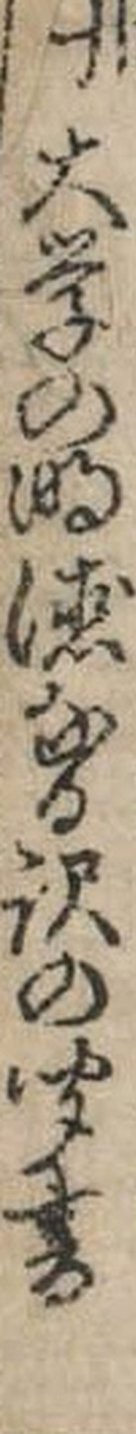大学の明徳なる訳の聞書

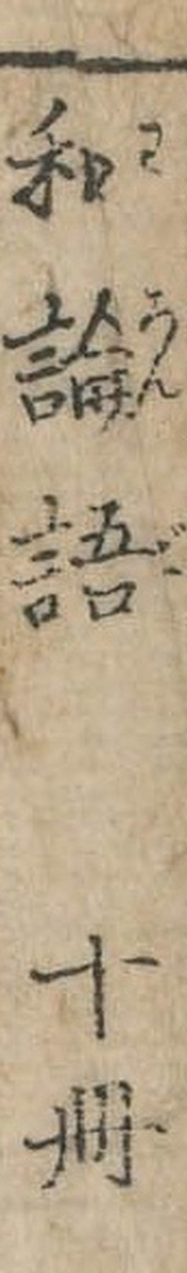和論語十冊
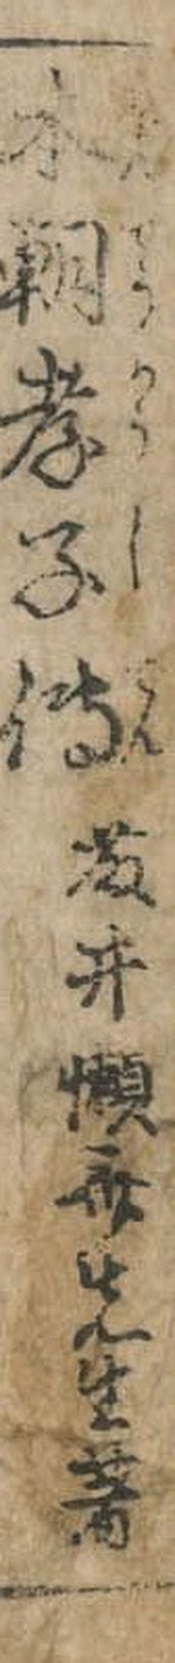本朝孝子伝藤井懶斎先生著
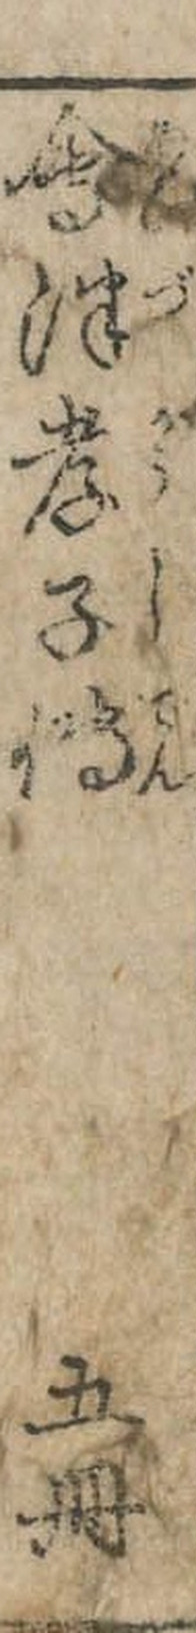会津孝子伝五冊
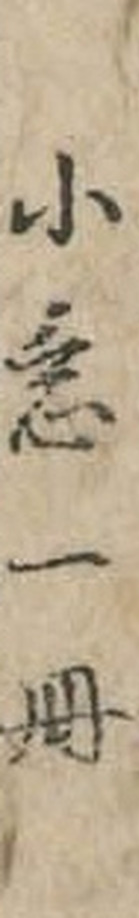小意一冊
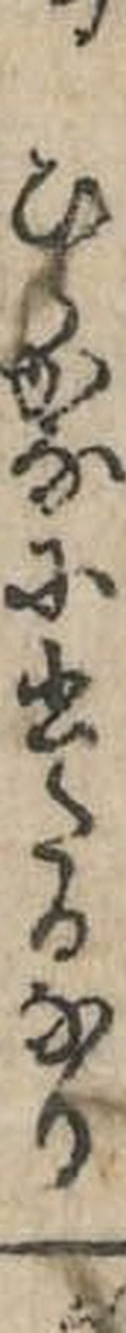ひらかなに書たるなり
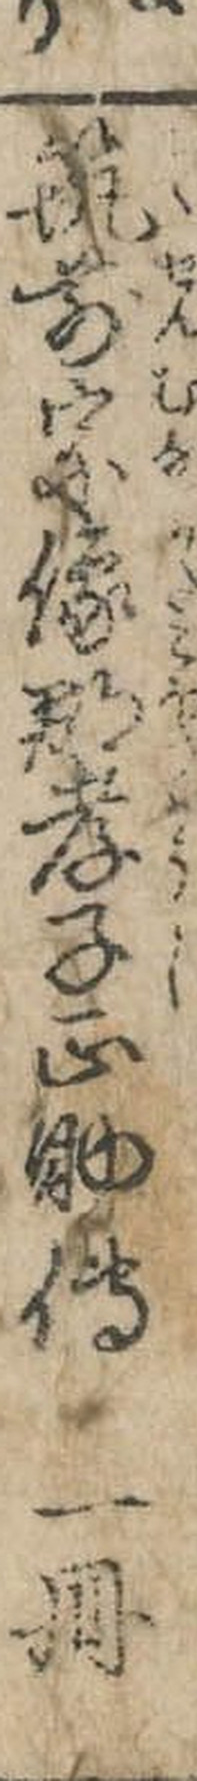筑前宗像郡孝子正助伝一冊
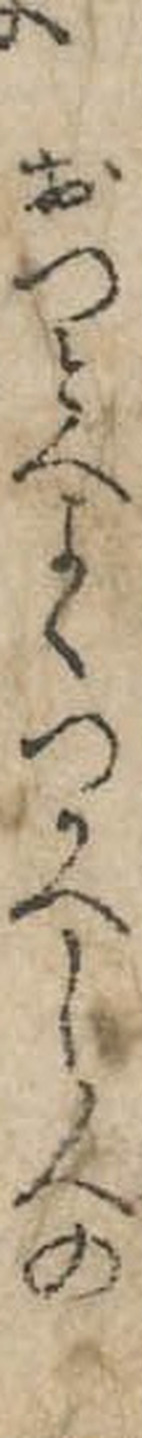常盤木おつとへよくつかへし人の
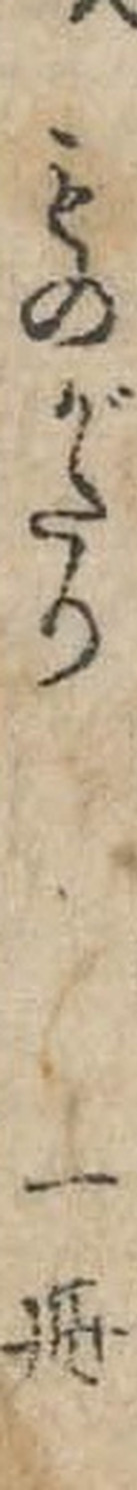ものがたり一冊
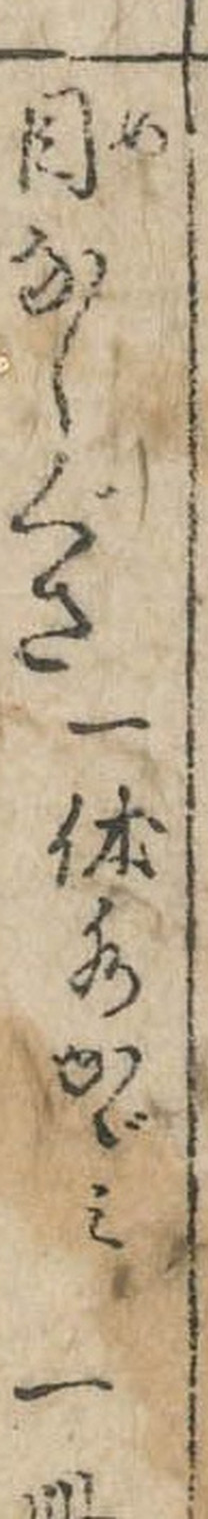目なしぐさ一休水かゞみ一冊
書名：前訓
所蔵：東京学芸大学附属図書館
